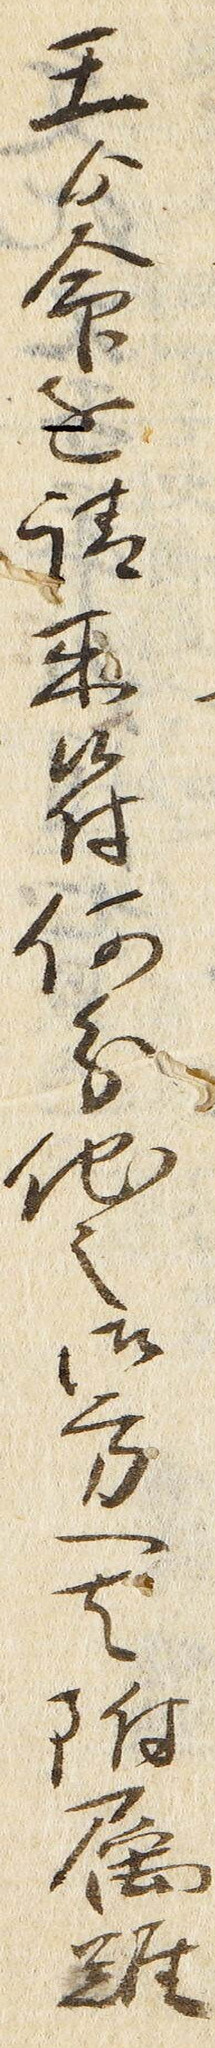王ゟ命を請来候付何分他之御方へは附属難
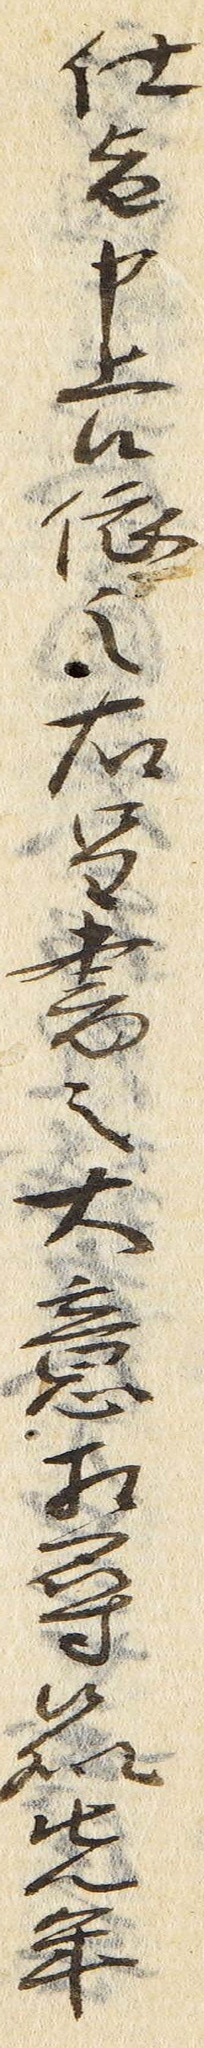仕旨申上候依之右呈書之大意相尋候処先年
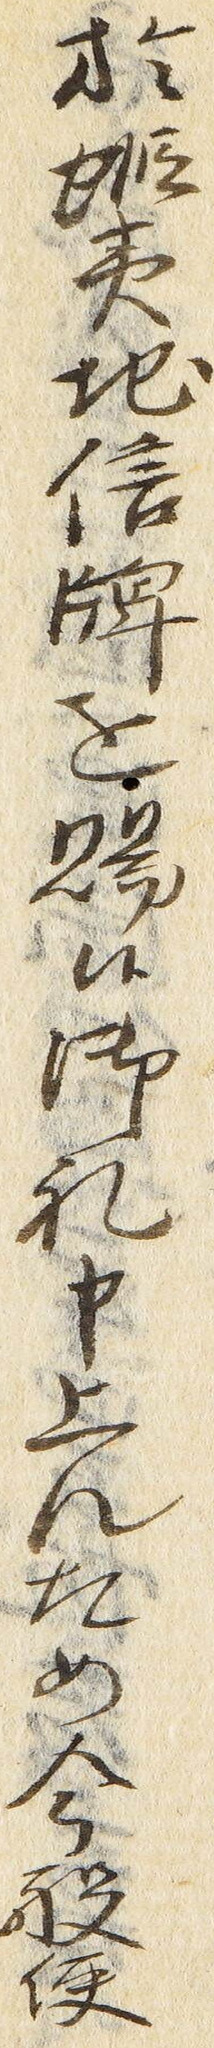於蝦夷地信牌を賜候御礼申上んため今般使
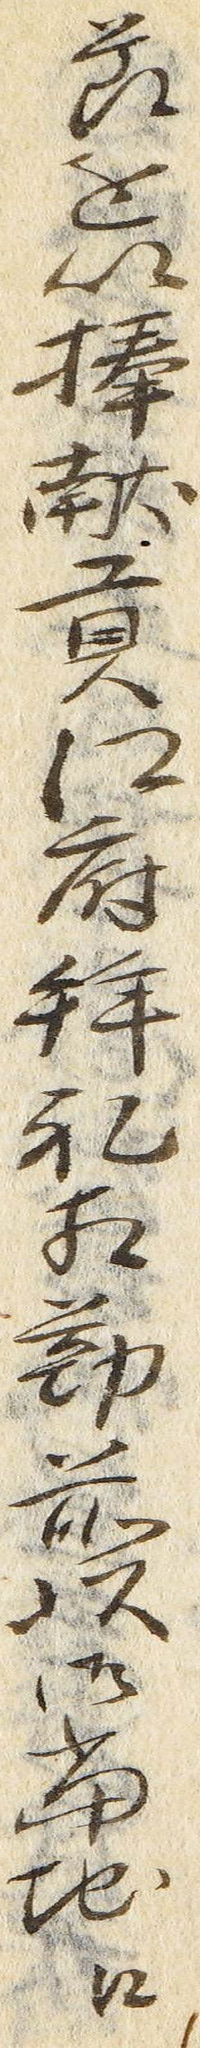節を以捧献貢江府拝礼相勤前以御当地え
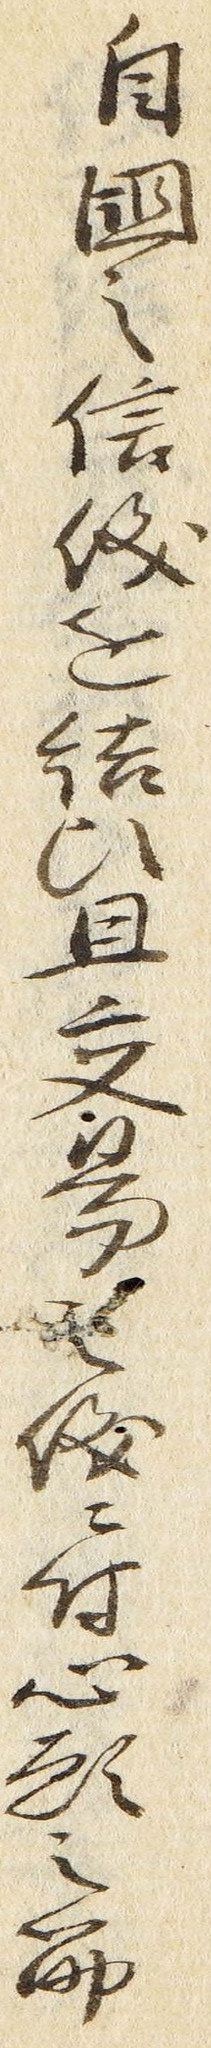自国之信儀を結ひ且交易之儀に付心願之筋
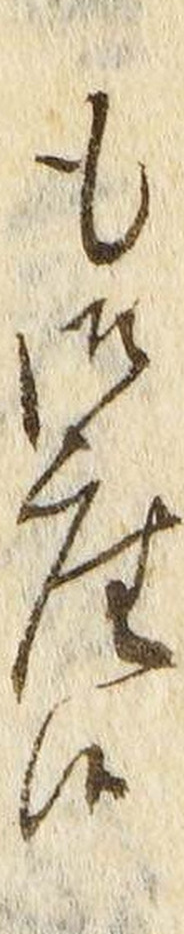も御座候
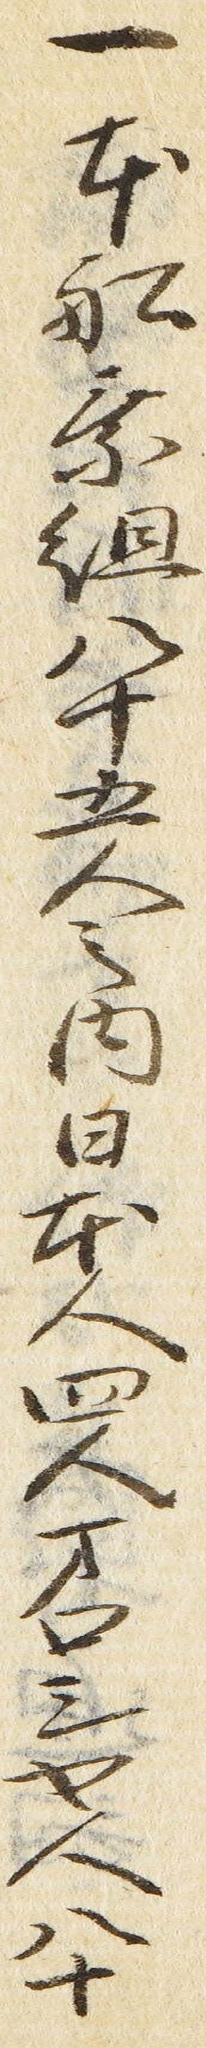一本船乗組八十五人之内日本人四人オロシヤ人八十
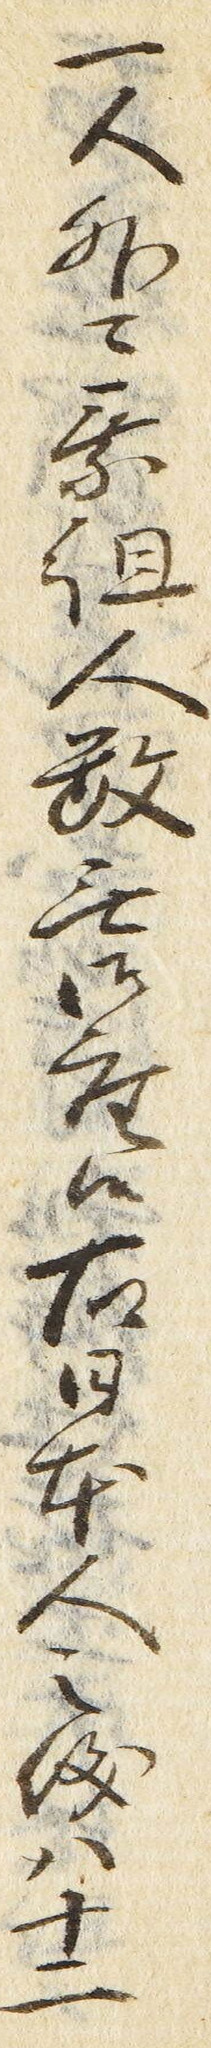一人外に乗組人数無御座候右日本人之儀は十二
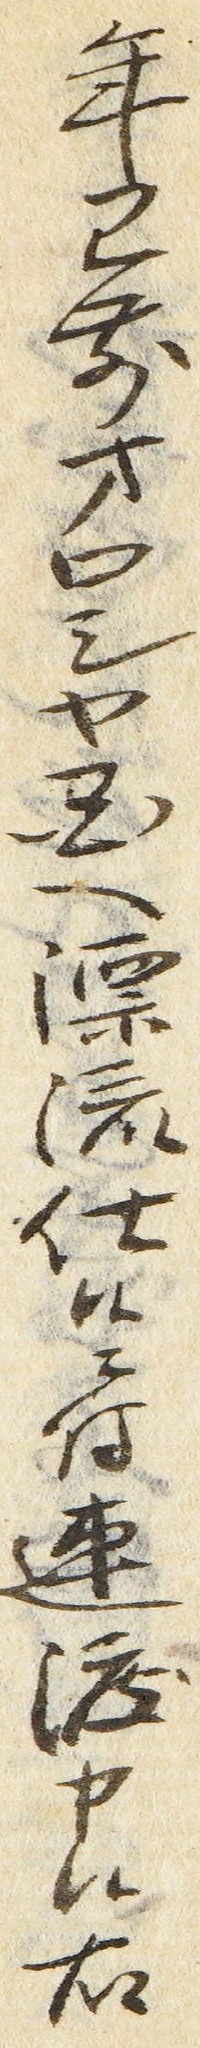年已前オロシヤ国へ漂流仕候に付連渡申候右
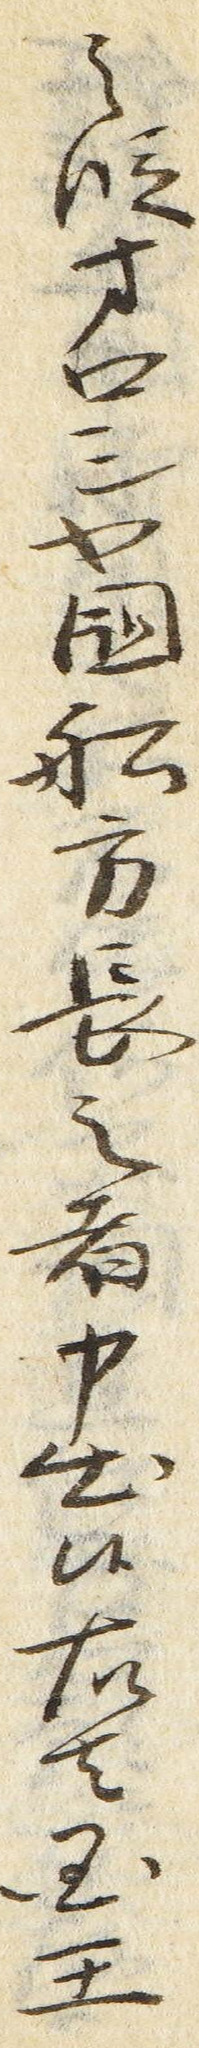之段オロシヤ国船方長之者申出候右は国王
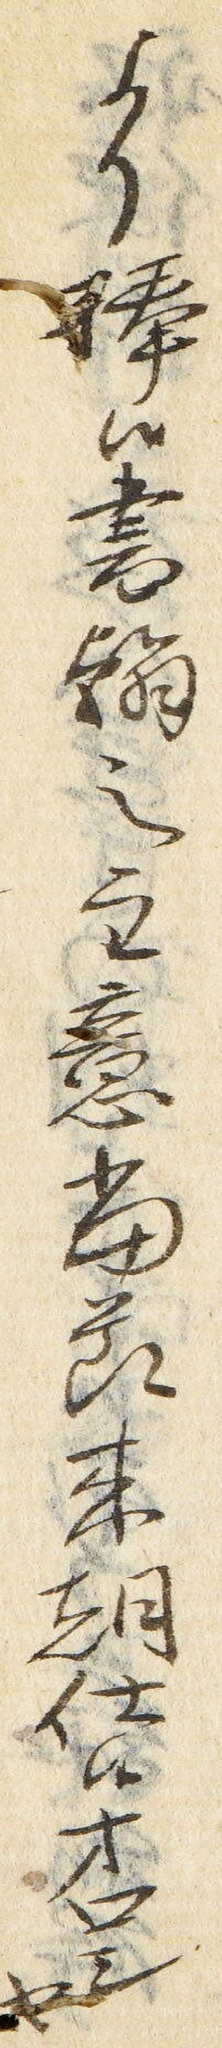より捧候書翰之主意当節来朝仕候オロシヤ

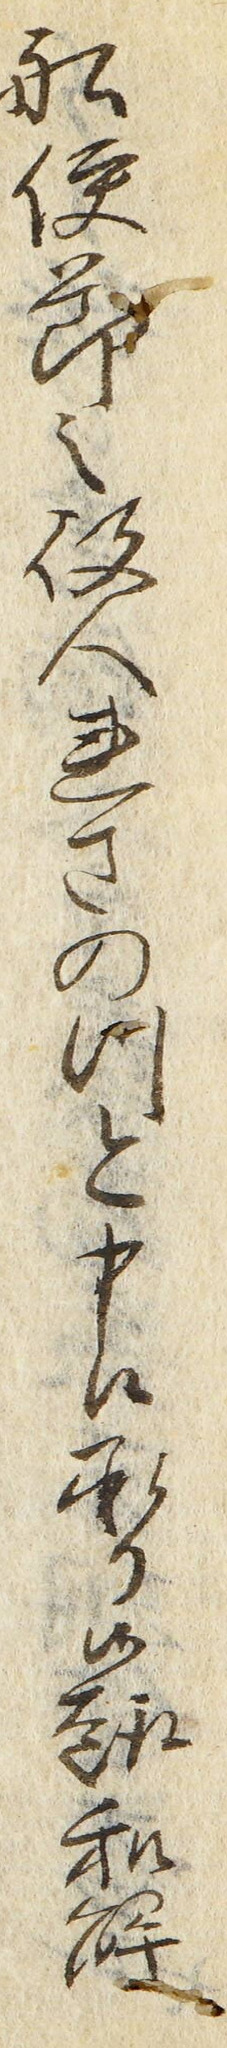船使節之役人れさのつと申候承り候趣和解
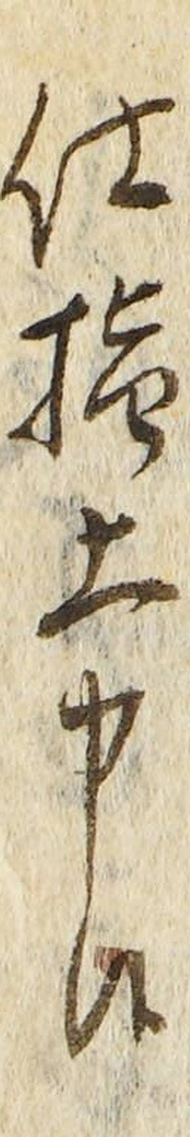仕指上申候
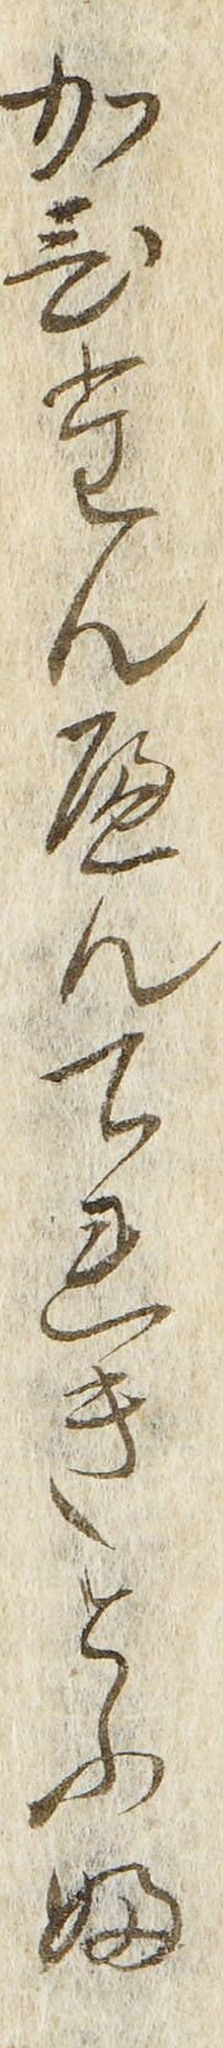かひたんへんてれきとふふ
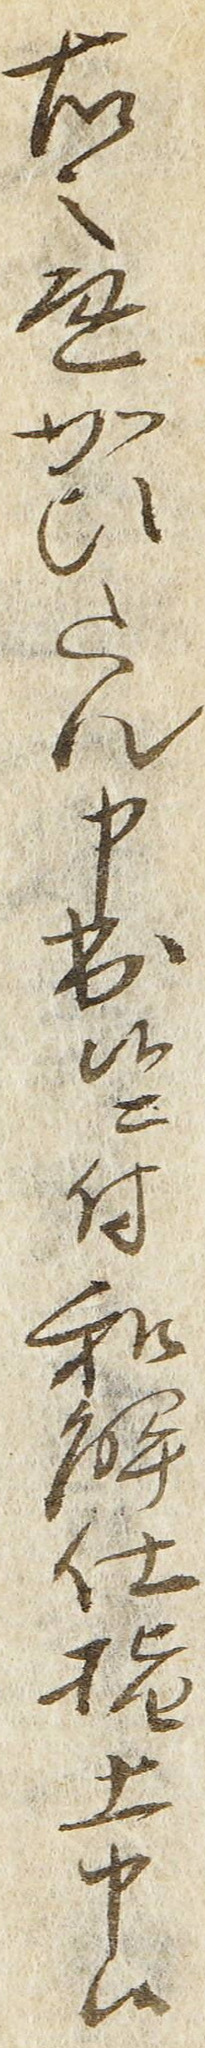右之通かひたん申出候に付和解仕指上申候
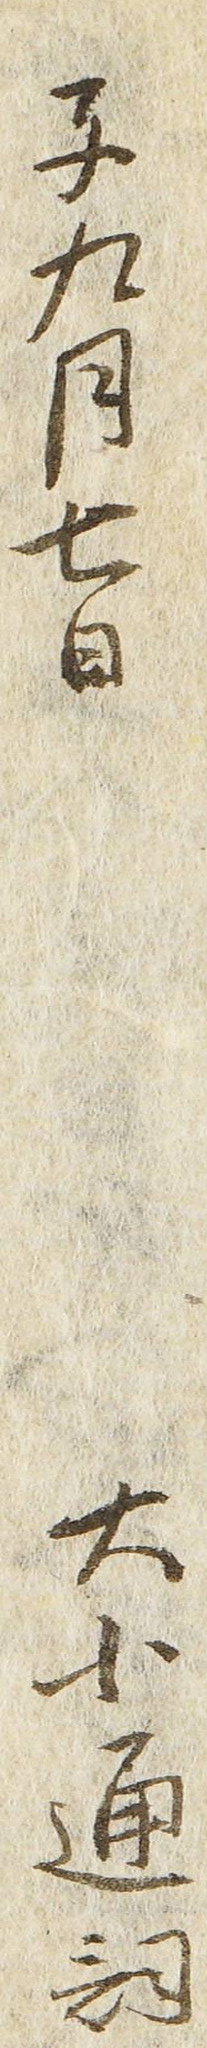子九月七日大小通詞
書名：漂民後記
